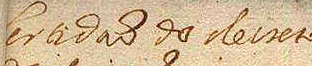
Certidaõ do decreto
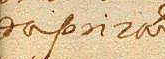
da prizaõ
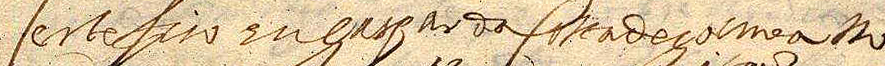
Certefico Eu Gaspar da Costa de Gouuea No
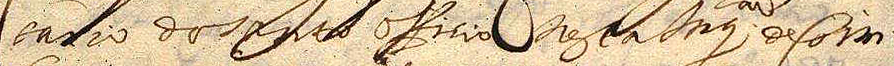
tario do santo officio nesta Inq.caõ de Coim
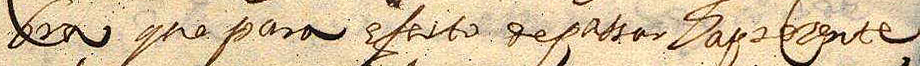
bra, que para Efeito de passar a prezente
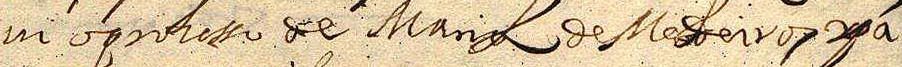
ui o processo de Maria de Medeiros xpā
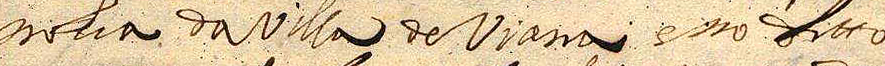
noua da villa de Viana e no ditto
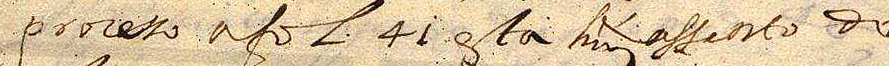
processo a foL. 41 esta hū assento do
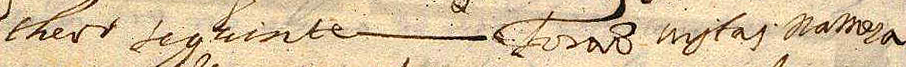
theor seguinte Foraõ uistas na meza
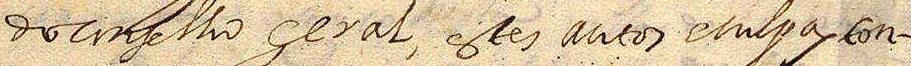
do conselho GeraL, estes autos E culpas con
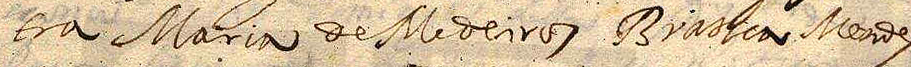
tra Maria de Medeiros Branca Mendes
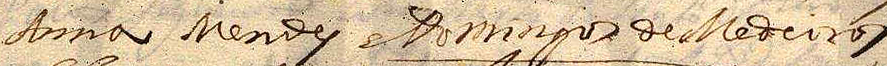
Anna Mendes E Domingos de Medeiros,
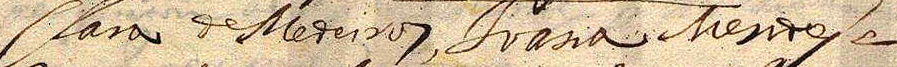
Clara de Medeiros, Joana Mendes e
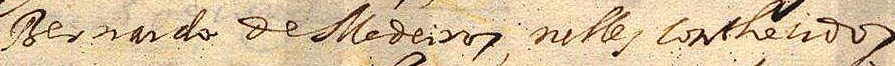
Bernardo de Medeiros, nelles contheudos
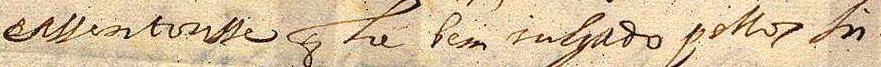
e assentousse q̄ he bem iulgado pellos In
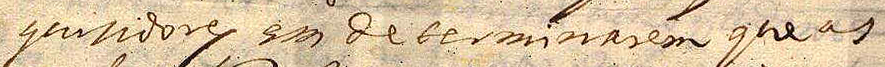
quizidores, Em determinarem que as
